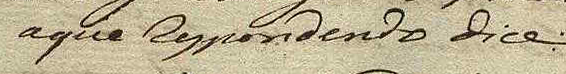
a que Respondendo dice:
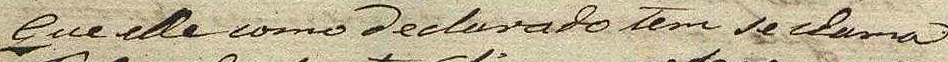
Que elle como declarado tem se chama
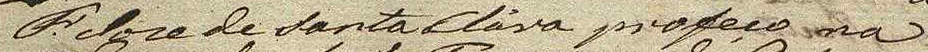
F.r Ioze de santa Clára profeço na
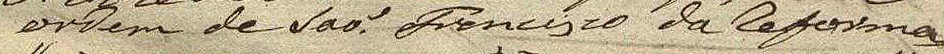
ordem de saõ Francisco da Reforma
